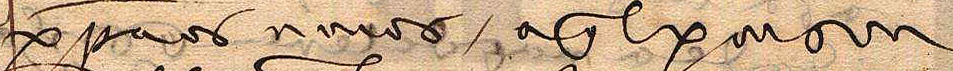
xpãos nouos / a q̅l pousou
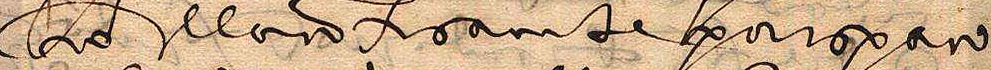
co̅ ella co̅fesamte por espaço
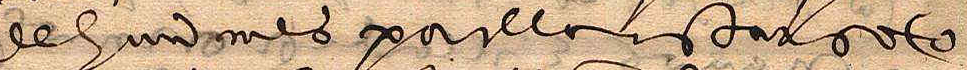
de hu̅n mes por ella estar soo
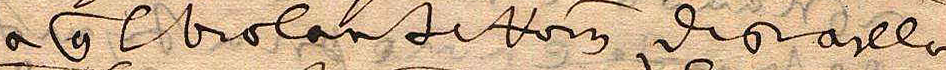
a q̅l violante Ro̅iz dise a ella
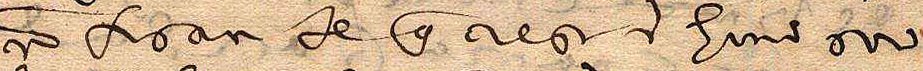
co̅fesante q̅ crese e̅ huu̅ soo
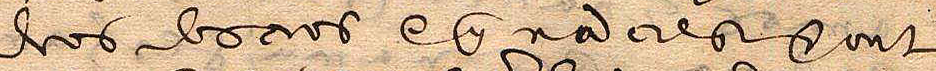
deos dos ceos e q̅ na̅ crese e̅ outa
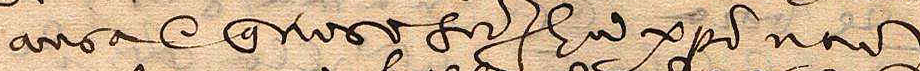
cousa e q̅ noso sor Jhu̅ xpo̅ naō
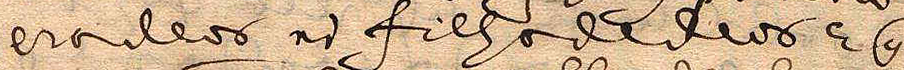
era deos ne̅ filho de deos E q̅
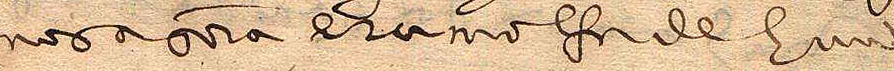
nosa s̅ora era molher de huu̅
